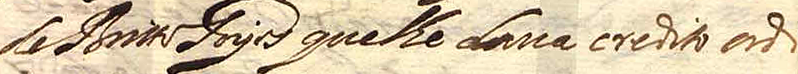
de Britto Foyos que lhe daua credito ordi
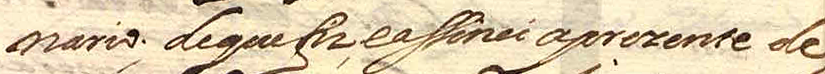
nario; de que fiz, e assinei a prezente de
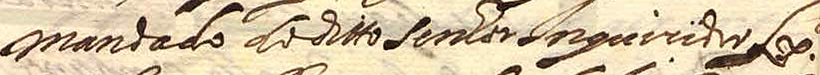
mandado do ditto senhor Inquizidor Lx.a
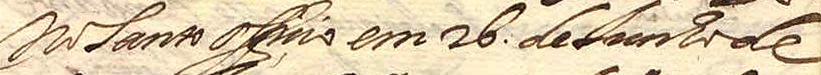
No Santo offiçio em 26. de Junho de
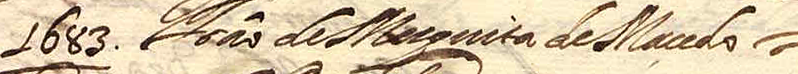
1683. João de Mesquita de Maçedo =
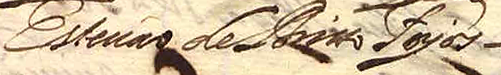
Esteuão de Britto Foyos
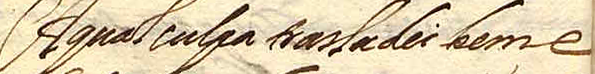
A qual culpa trasladei bem, e
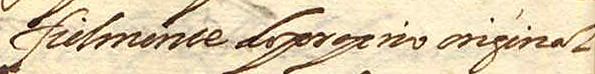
fielmente do proprio original
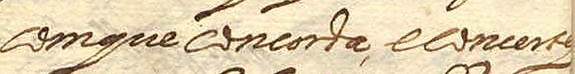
com que concorda, e concerte_
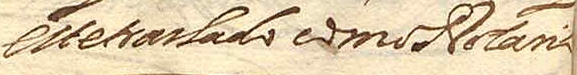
este traslado como Notario
